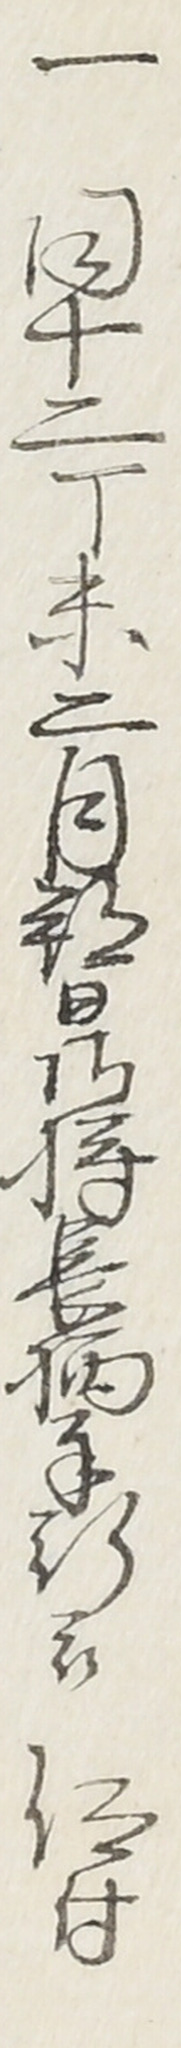一同十二丁未二月朔日御持長柄奉行被仰付
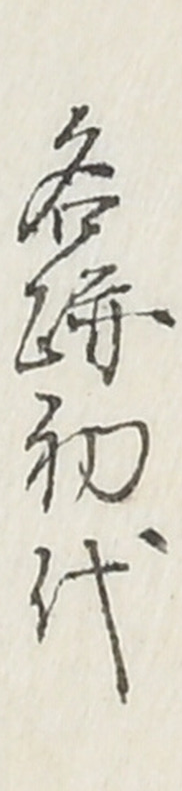名跡初代
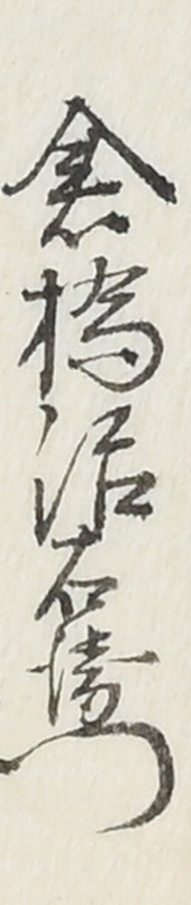倉橋治右衛門
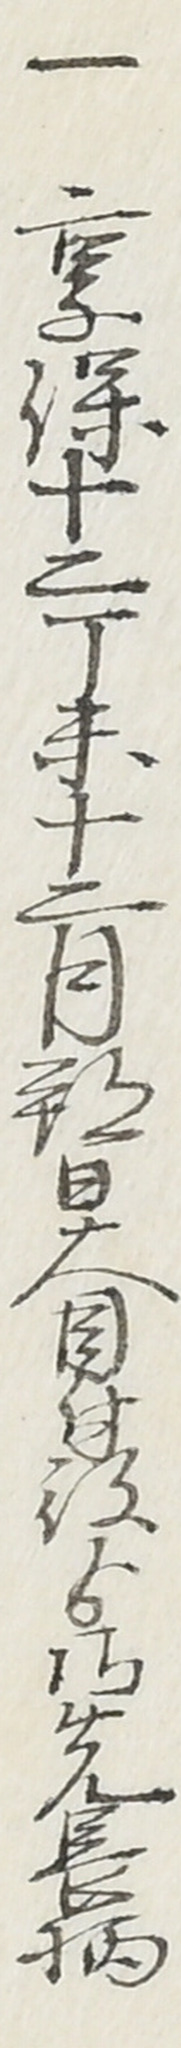一享保十二丁未十二月朔日大目付役ゟ御先長柄
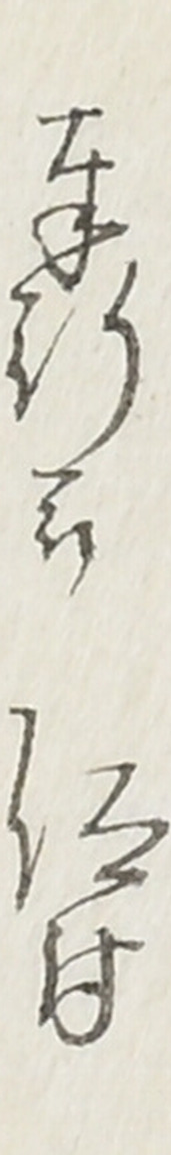奉行被仰付
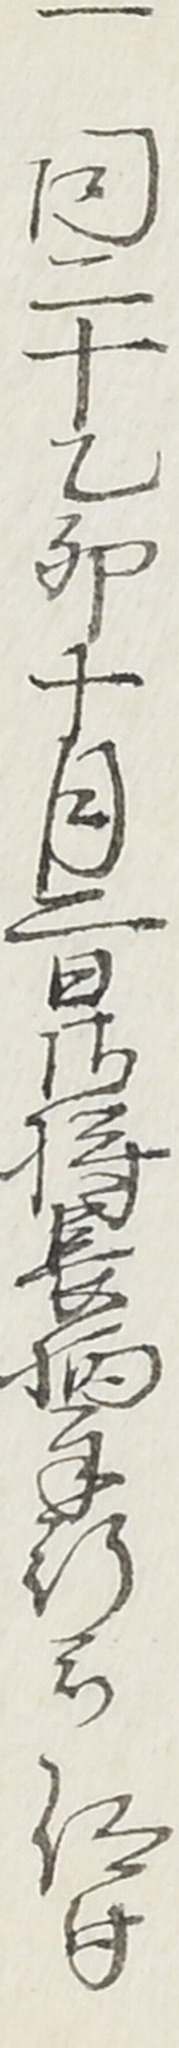一同二十乙卯十月二日御持長柄奉行被仰付
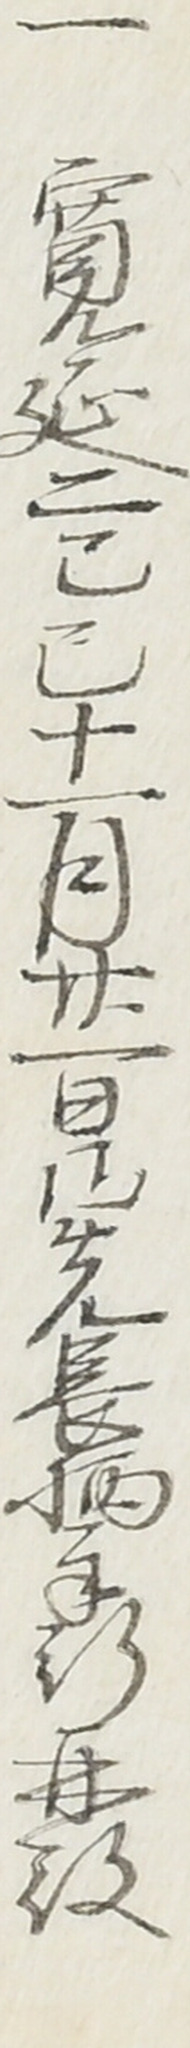一寛延二己巳十一月廿一御先長柄奉行再役
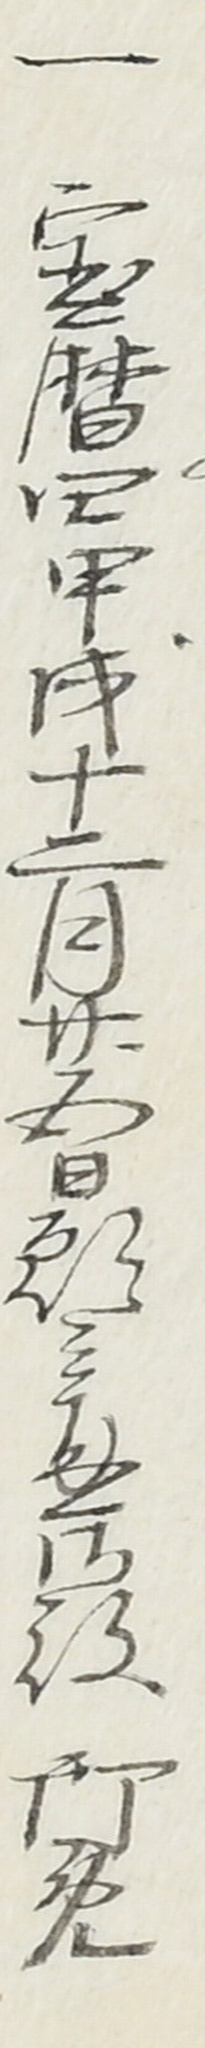一宝暦四甲戌十二月廿五日願之通御役御免
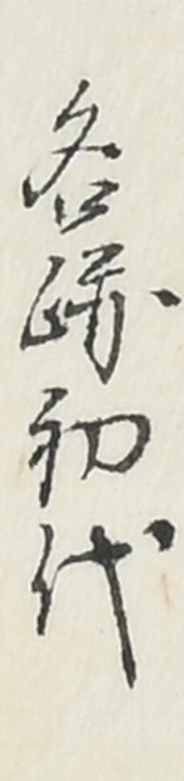名跡初代
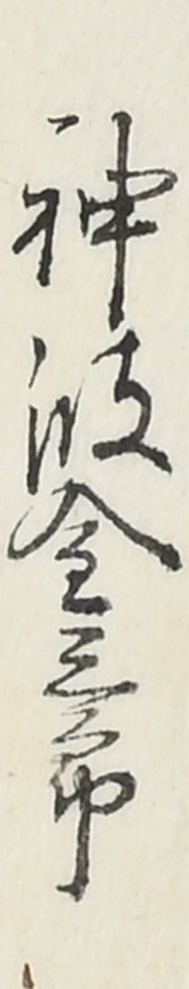神波金三郎

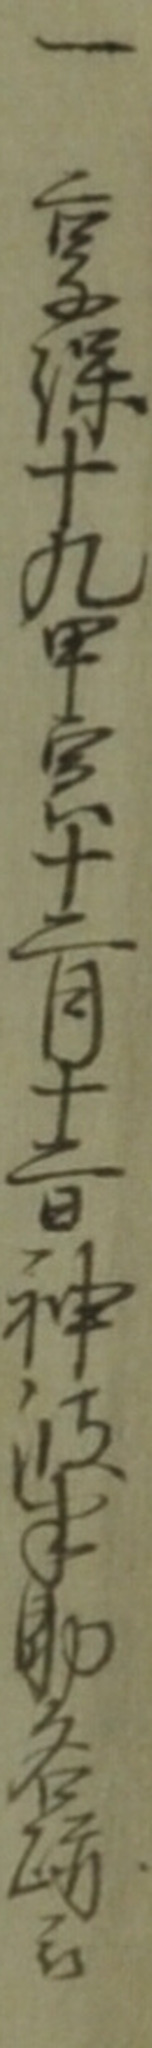一享保十九甲寅十二月十二日神波半助名跡被
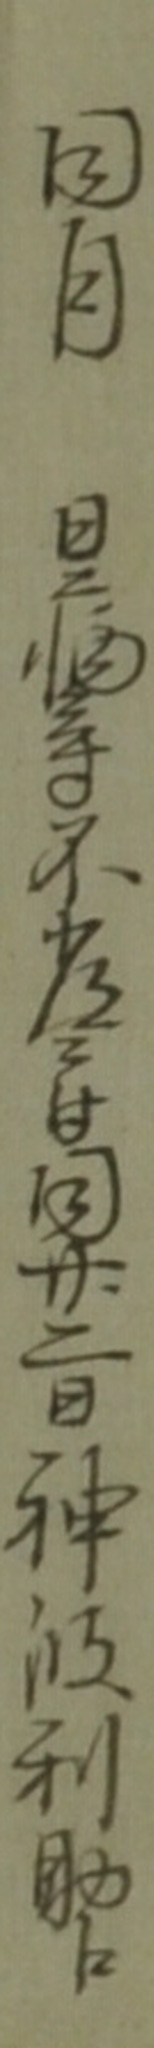一同月日病気不常二付同廿二日神波利助江
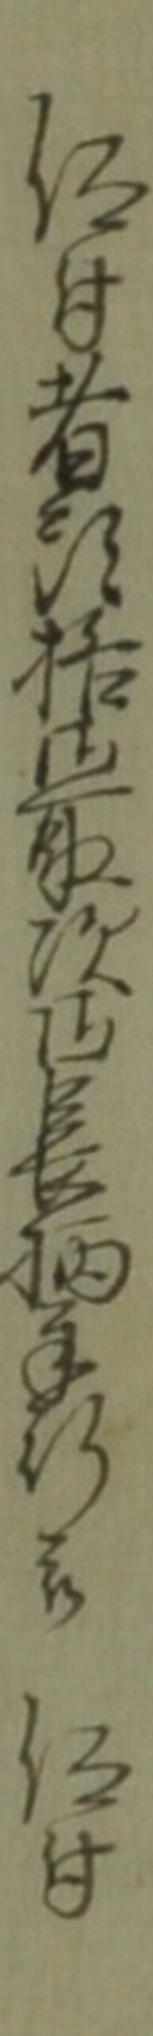仰付者頭格御取次御長柄奉行被仰付
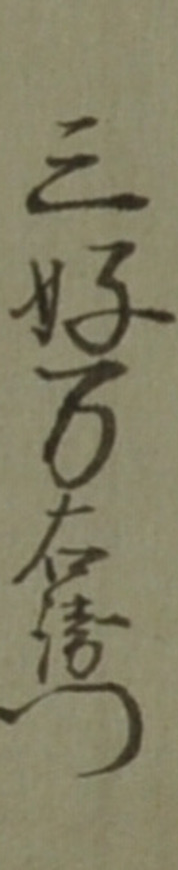三好万右衛門
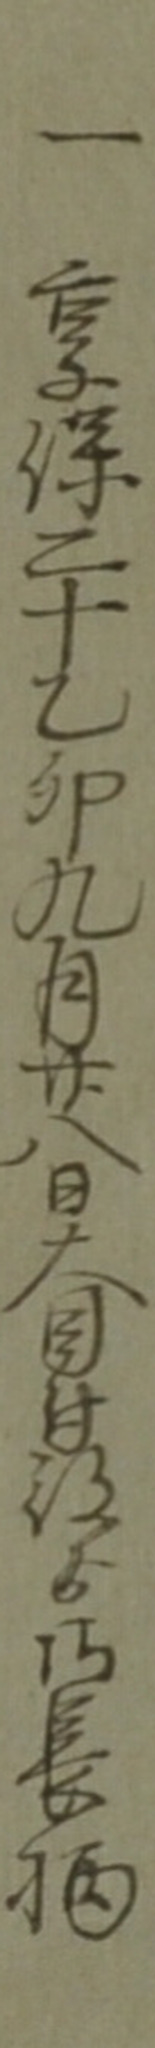一享保二十乙卯九月廿八日大目付役ゟ御長柄
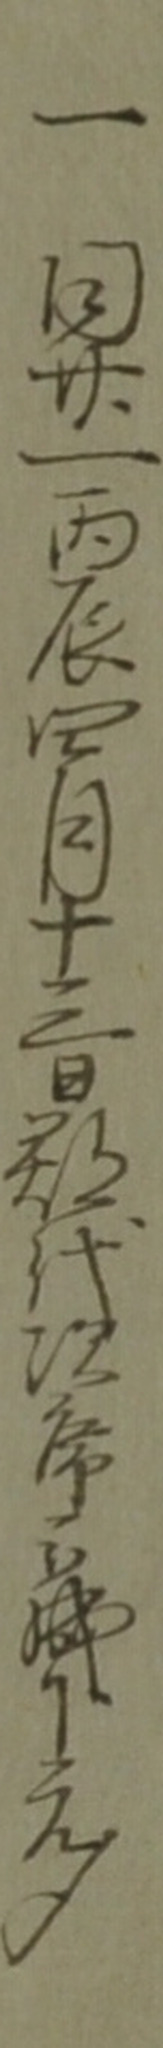一同廿一丙辰四月十三日郡代次席被成下元〆
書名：諸御役代々録（三）
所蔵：伊那市立高遠町図書館・合同会社AMANE
